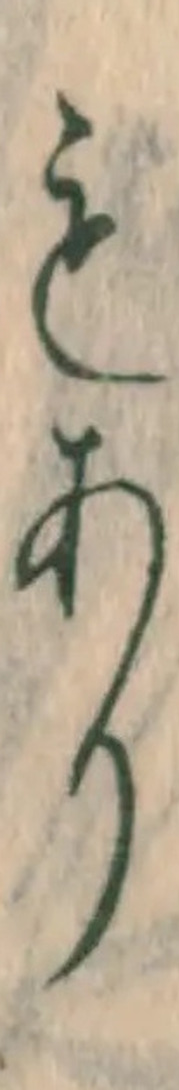もあり
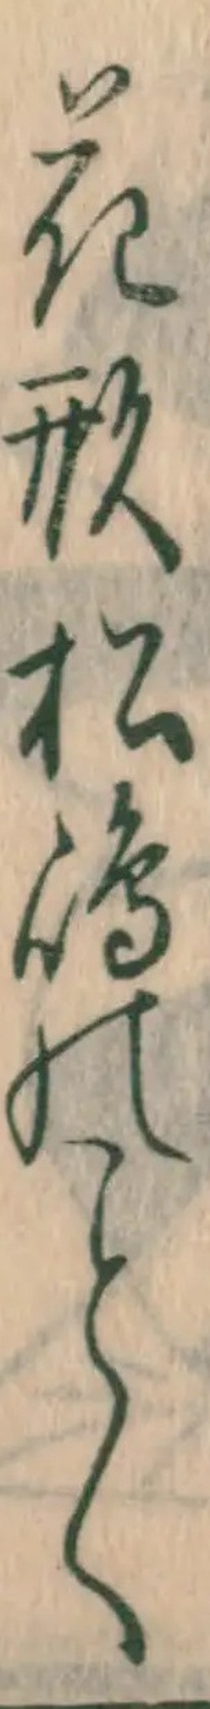花形松嶋のことく
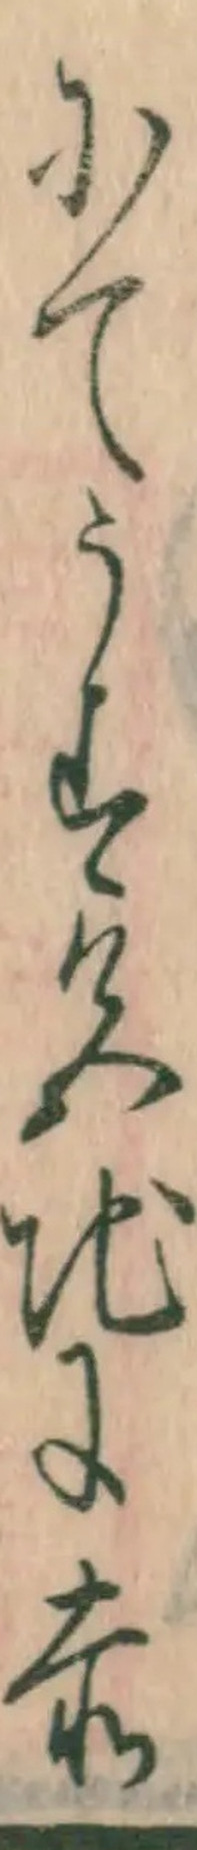にてうす色地に赤
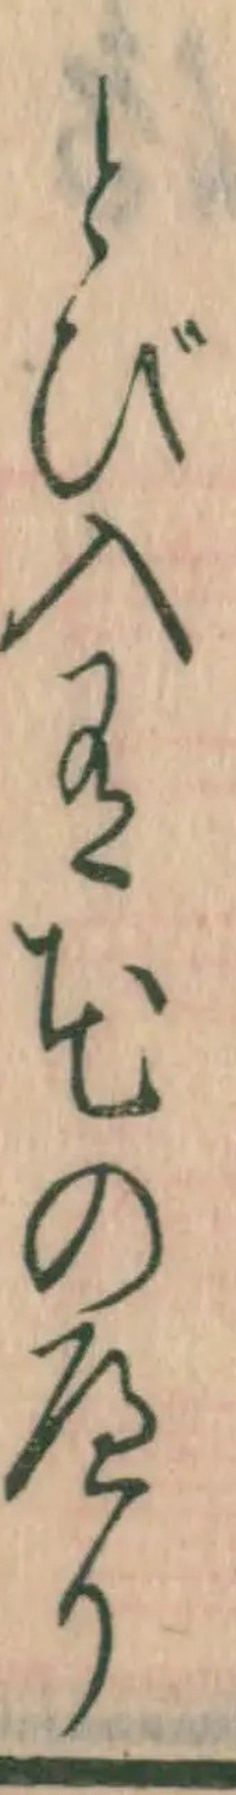とび入有花のへり
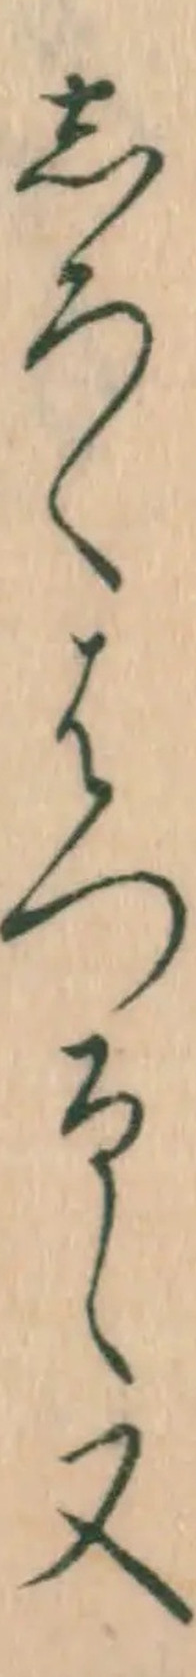しろくはつるゝ又
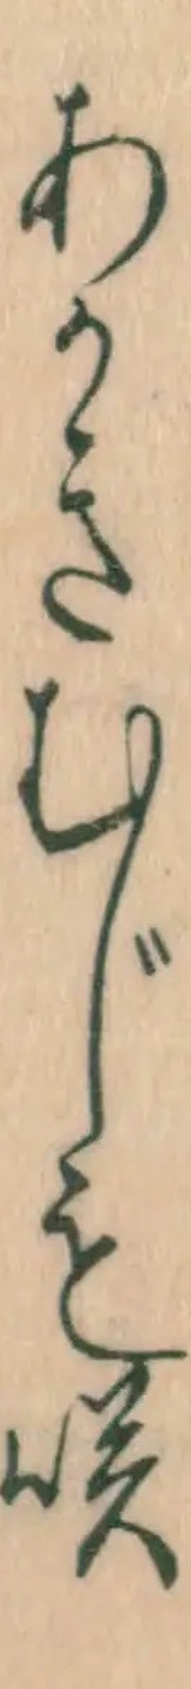あかきむじも咲
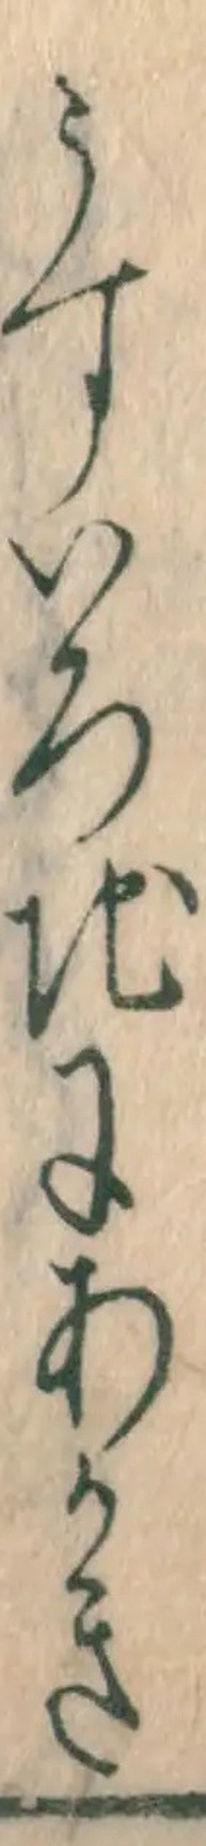うすいろ地にあかき
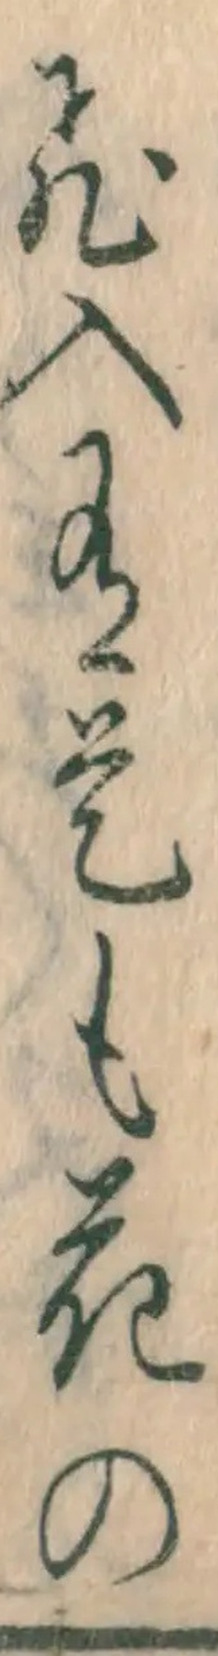飛入有是も花の

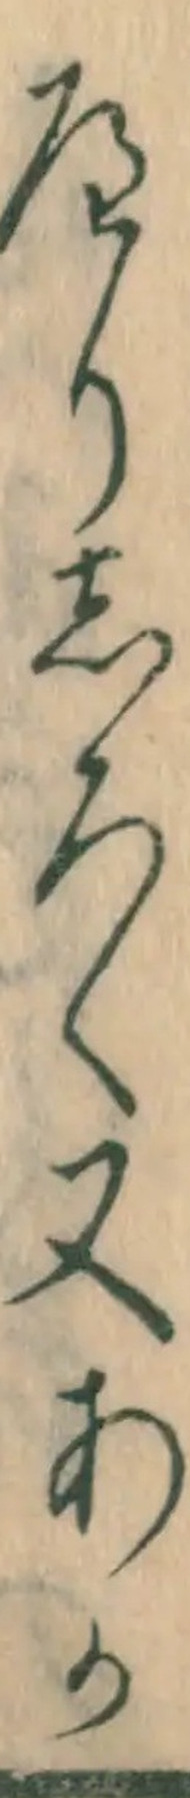へりしろく又あか
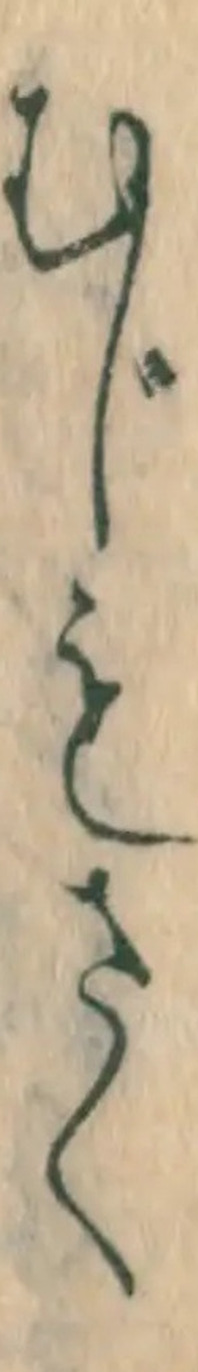むじもさく
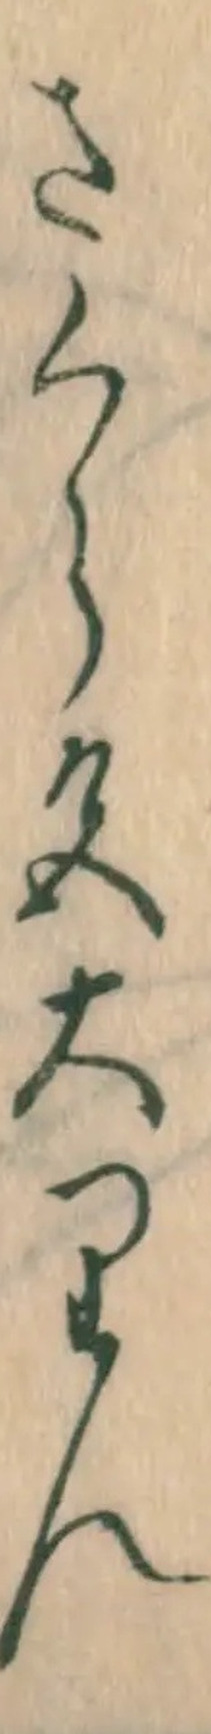さくら色大りん
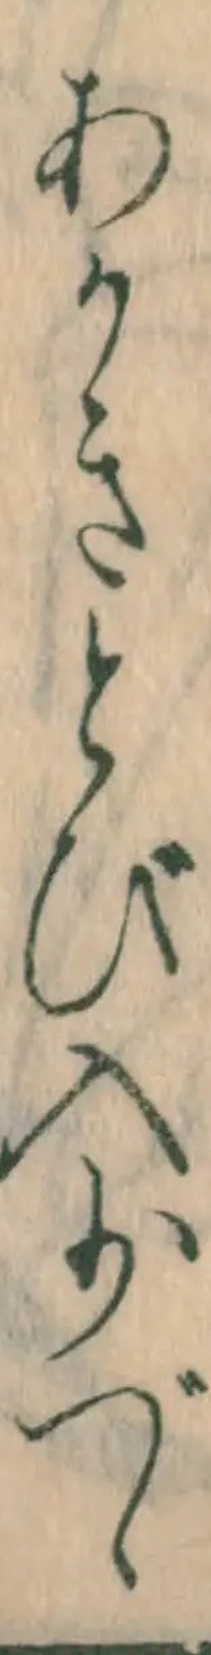あかきとび入少づゝ
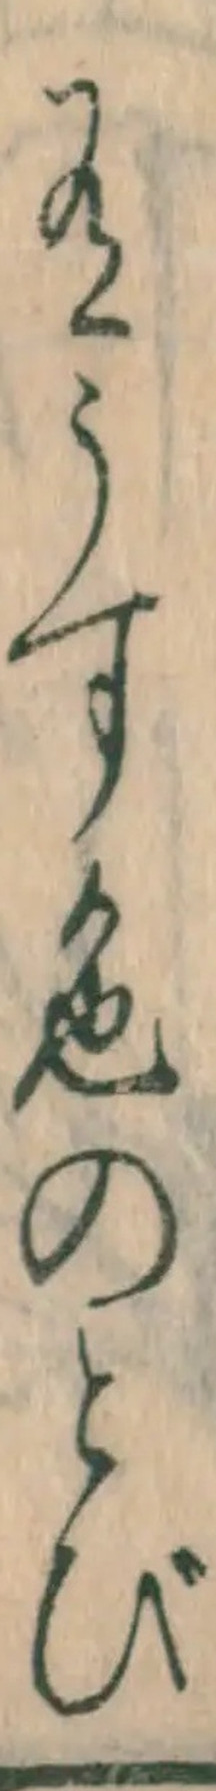有うす色のとび
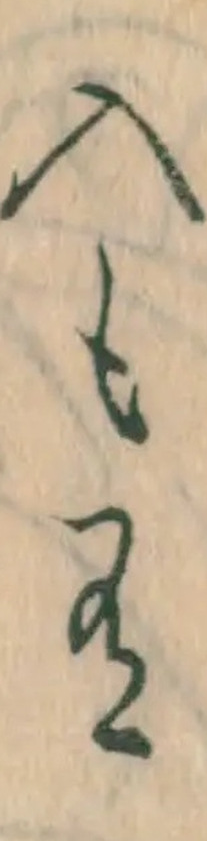入も有
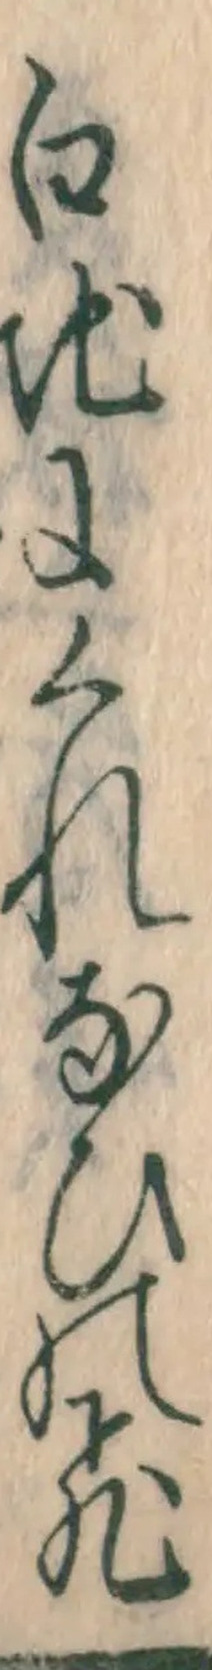白地にくれなひの飛
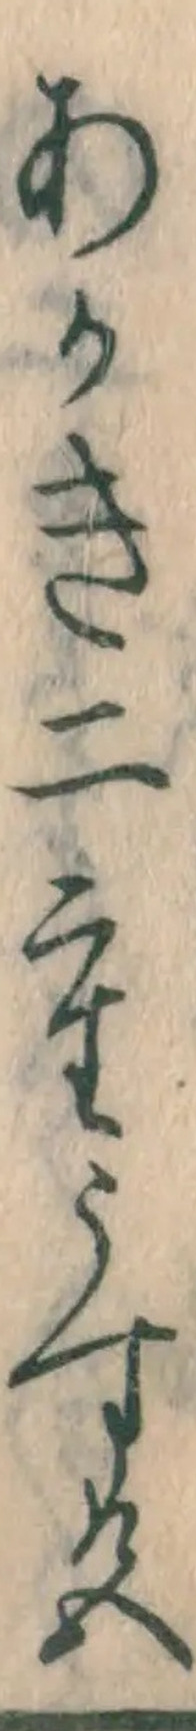あかき二重うす色
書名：錦繍枕 5巻. [4]
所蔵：国立国会図書館 National Diet Library, JAPAN
